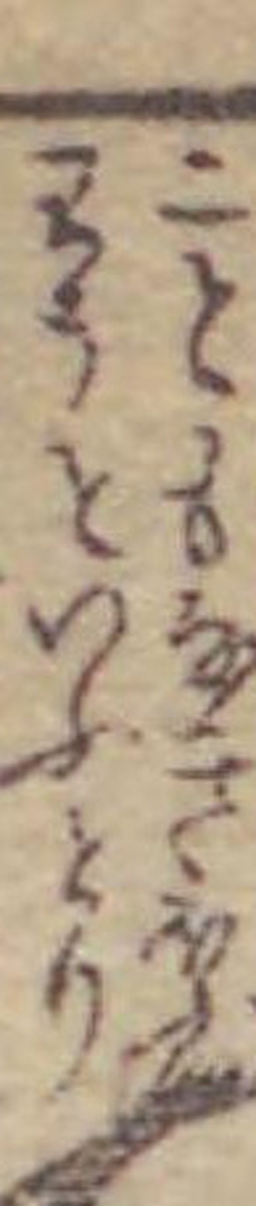わうといふとり
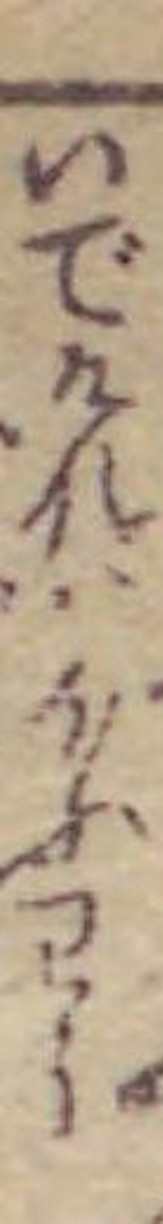いでけれはほうわう
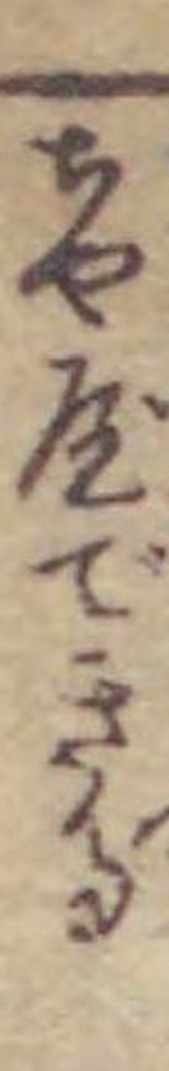ちや屋できる
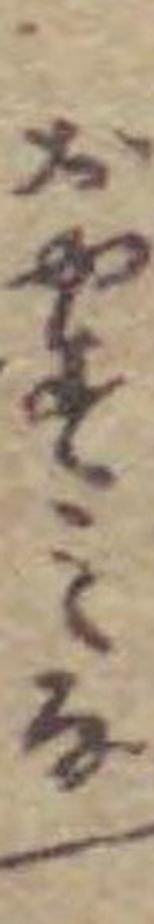おやすみな
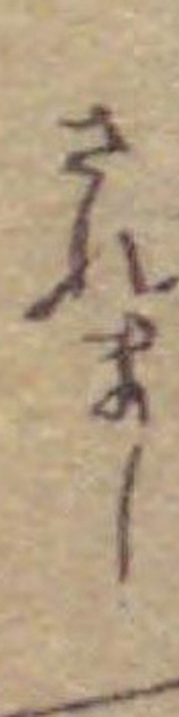されまし

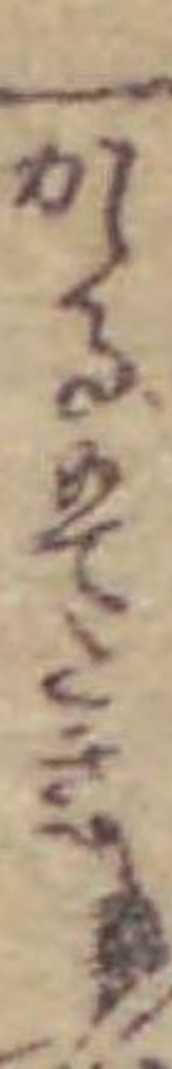かゝるめてたき
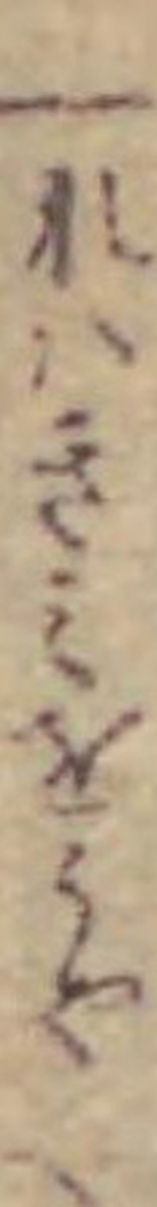れはきみをうや
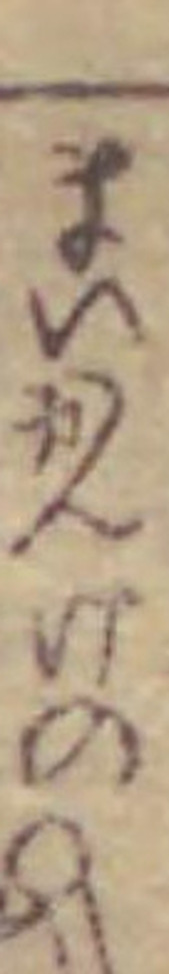まいかんけの
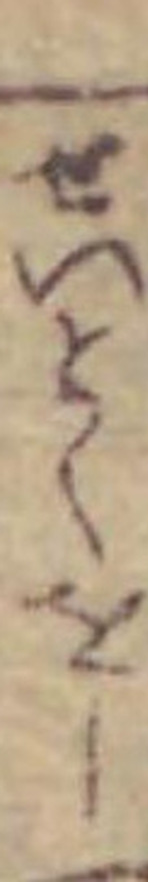せいとくをし
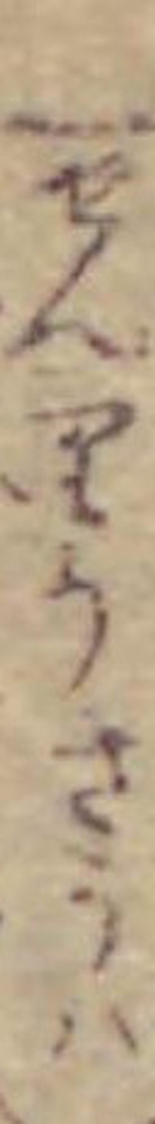せんりうきうは
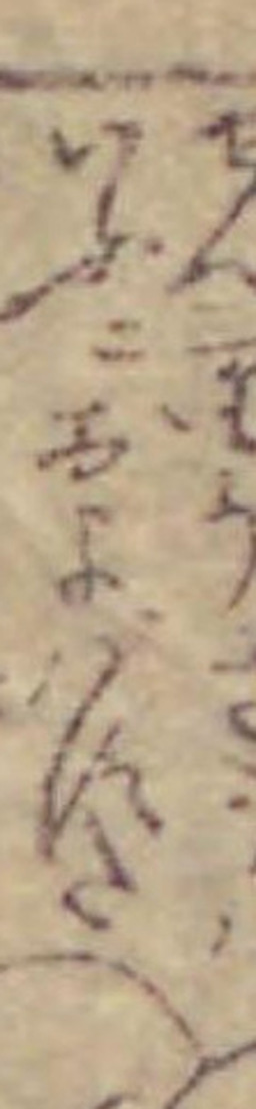いふにおよばすた
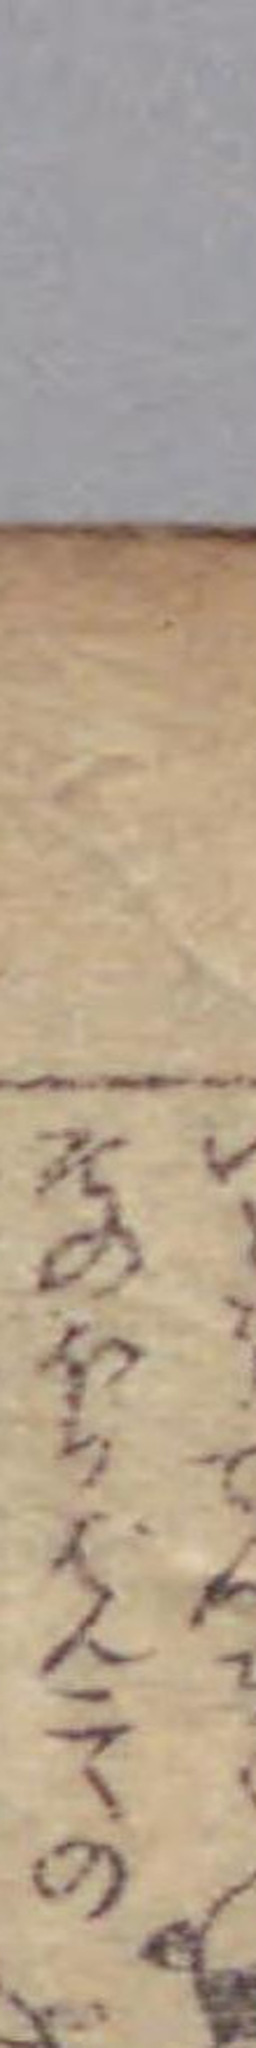そのほかばんこくの
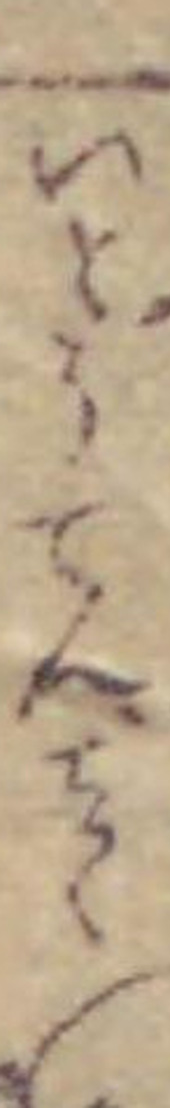とうてんちく
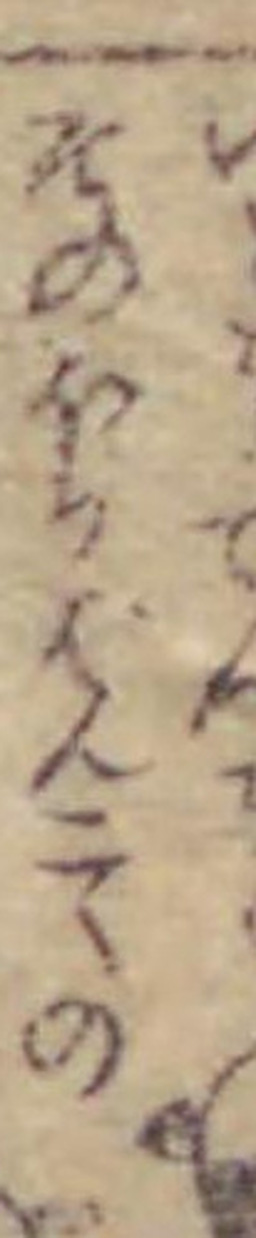そのほかばんこくの
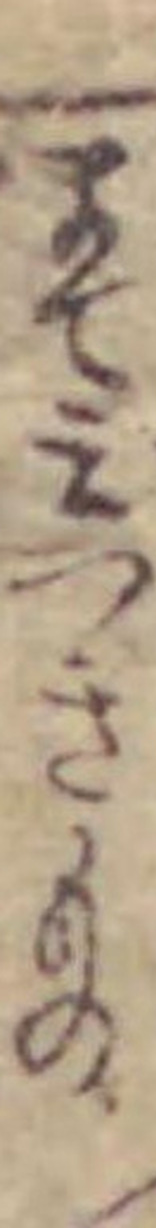まてみつきもの
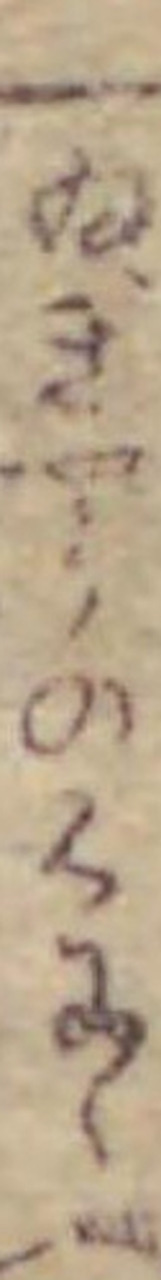ゐきやうのくに〳〵
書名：天下一面鏡梅鉢 : 3巻
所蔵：国立国会図書館 National Diet Library, JAPAN
